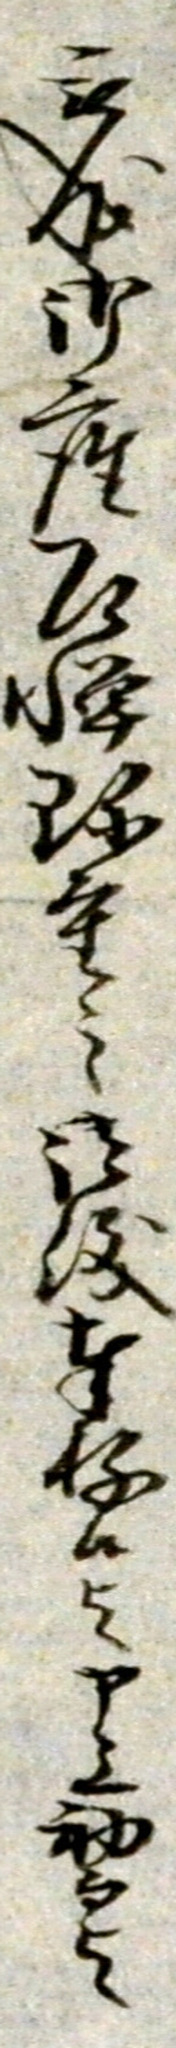被成御座乍憚致重之御儀奉存候と申上初而と
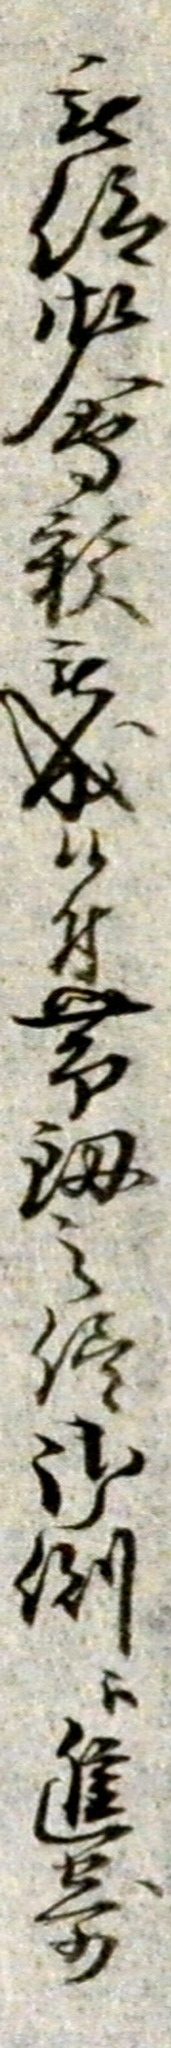被仰御会釈被成候付帯剣之儘御側江進寄
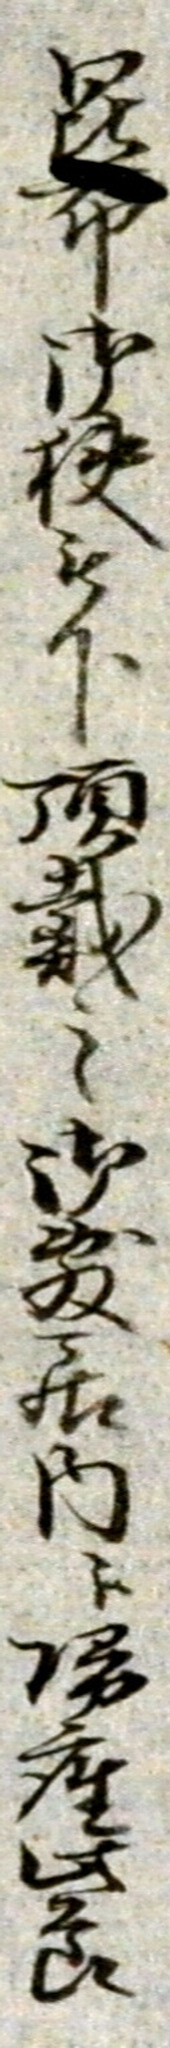昆布御挟被下頂戴之御敷居内江帰座此節
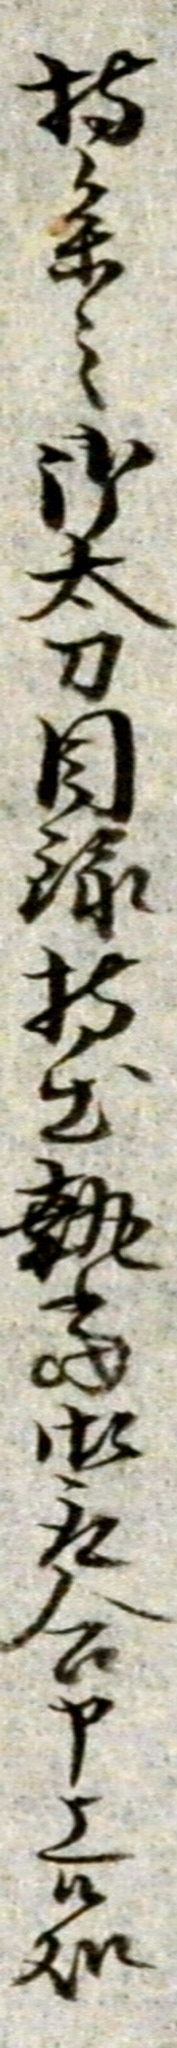持参之御太刀目録持出執当御取合申上候処
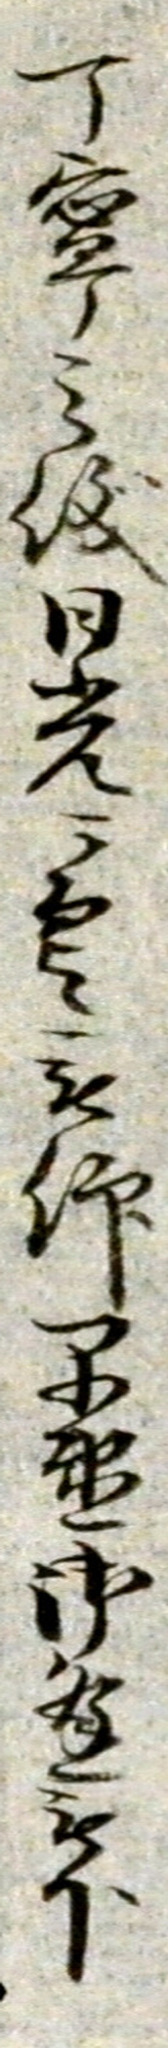丁寧之儀日光ニ而者被仰早速御逢被下
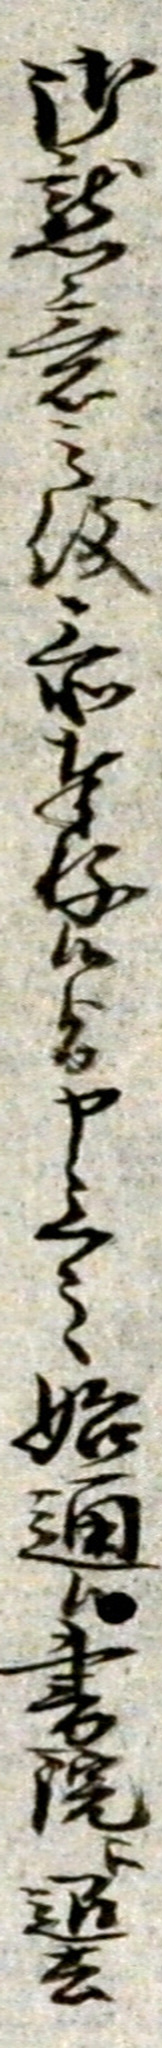御懇意之儀之所奉存候旨申上之始通候書院江退去
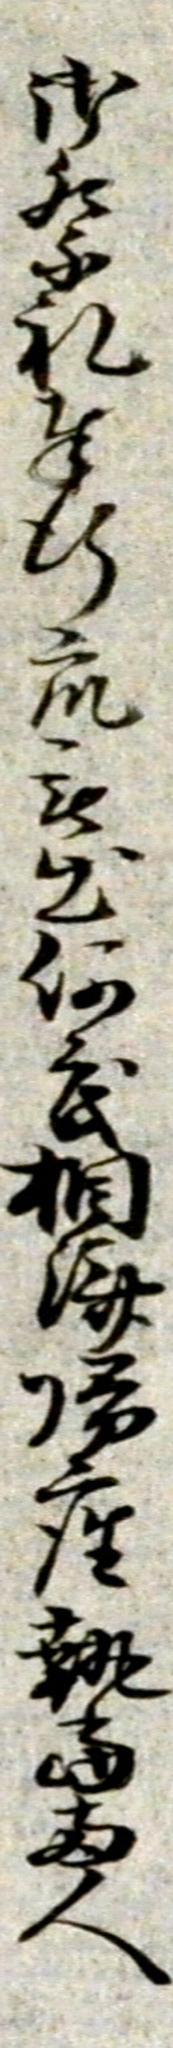御祭礼奉行衆被出何も相済帰座執当両人
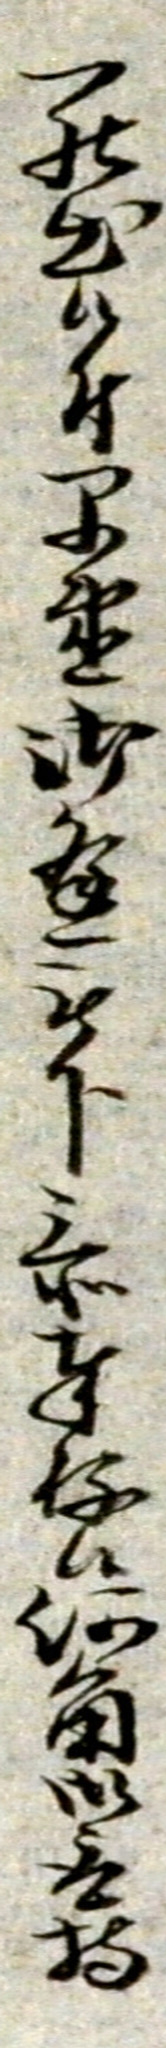罷出候付早速御逢被下之所奉存候何角御取持
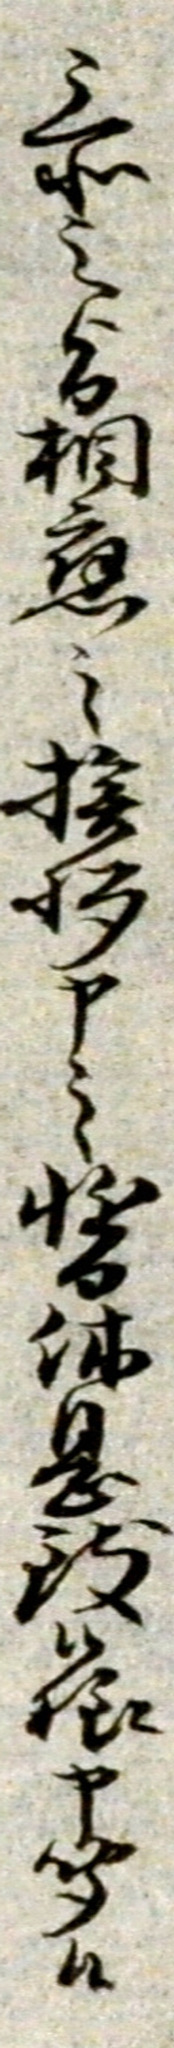置之旨相応之挨拶申之暫休息致候様申聞候
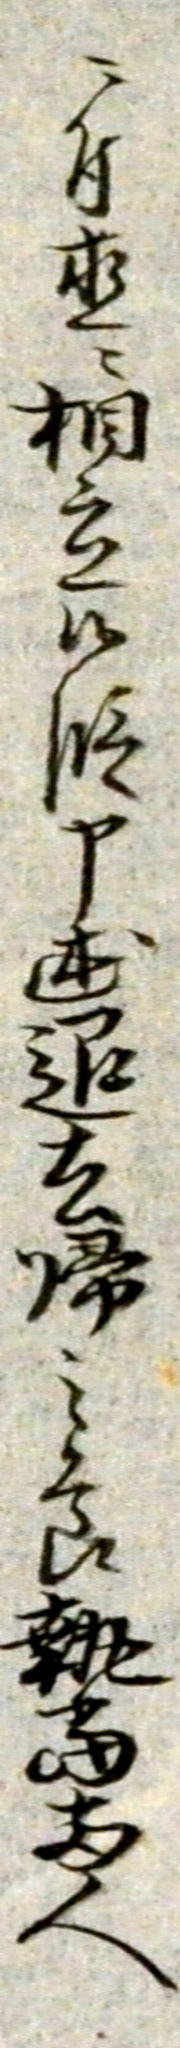ニ付直ニ相立候段申述退去帰之節執当両人
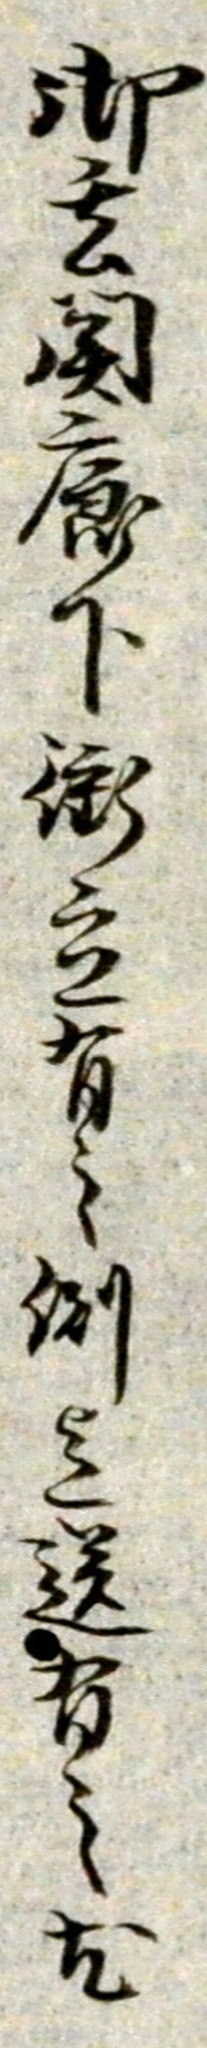御玄関廊下衝立有之例迄送有之尤
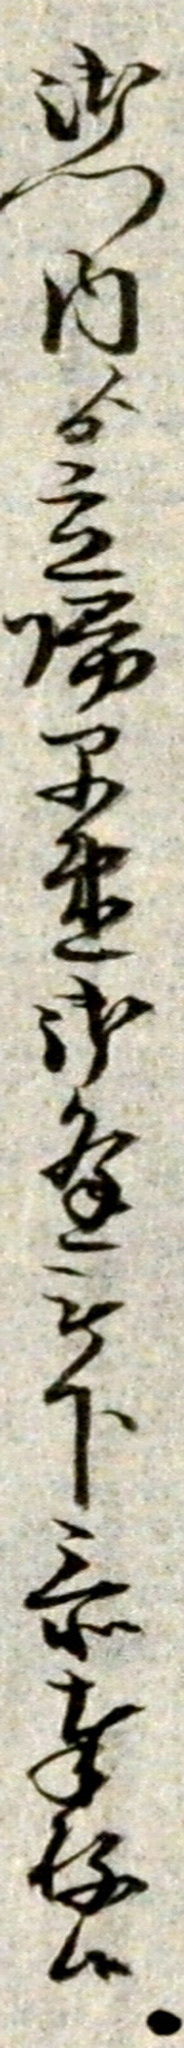御門内ゟ立帰早速御逢被下置奉存候
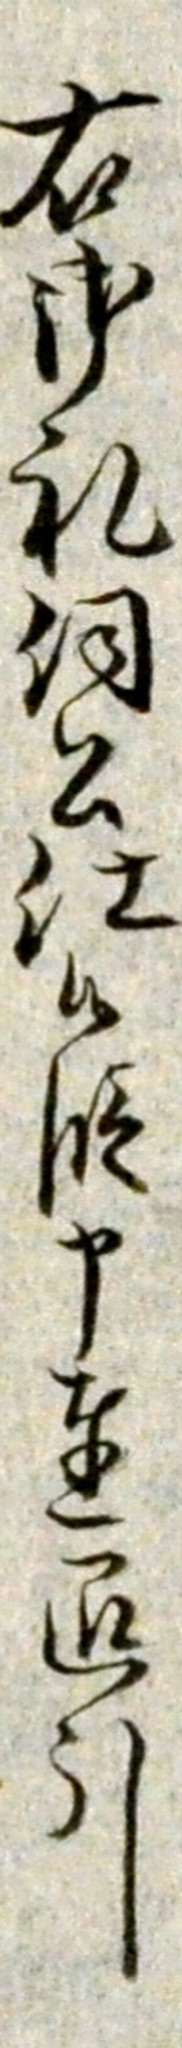右御礼伺公仕候段申達退引
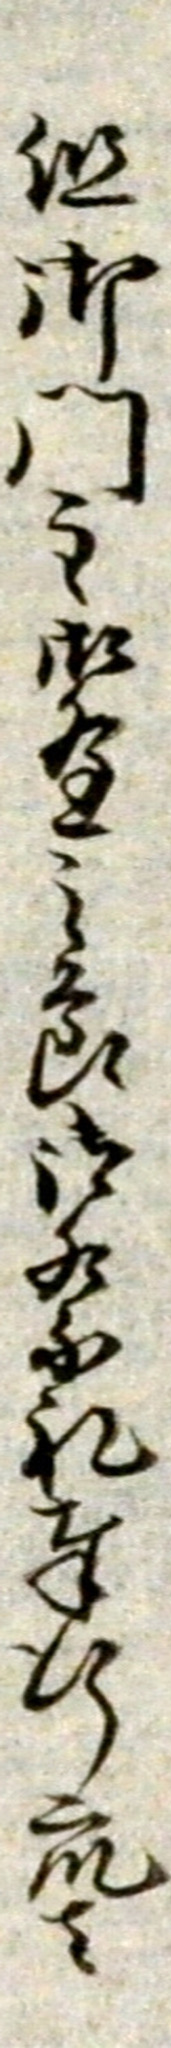但御門主御逢之節御祭礼奉行衆者
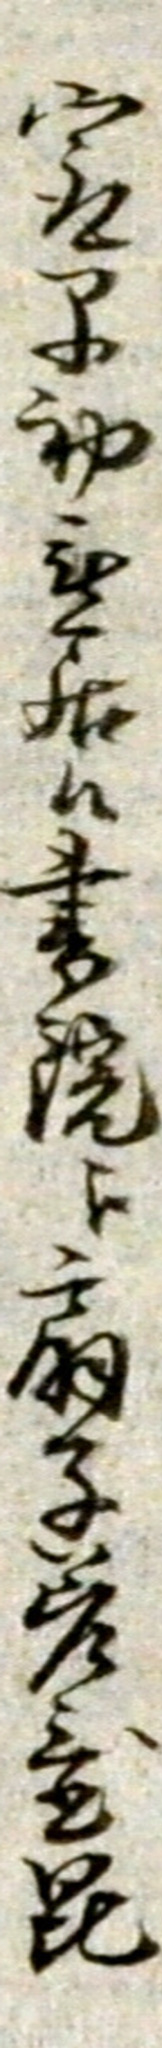最早初被居候書院江扇子差置昆
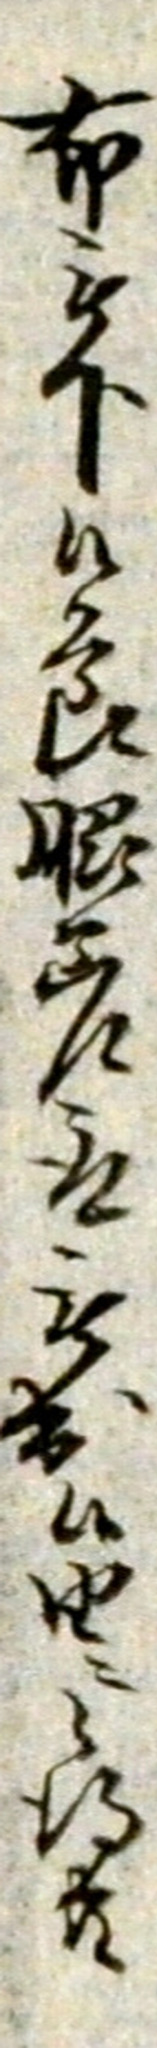布被下候節脇差取被出候由ニ候得共
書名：日光御名代相勤候節ノ留
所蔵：伊那市立高遠町図書館・合同会社AMANE
